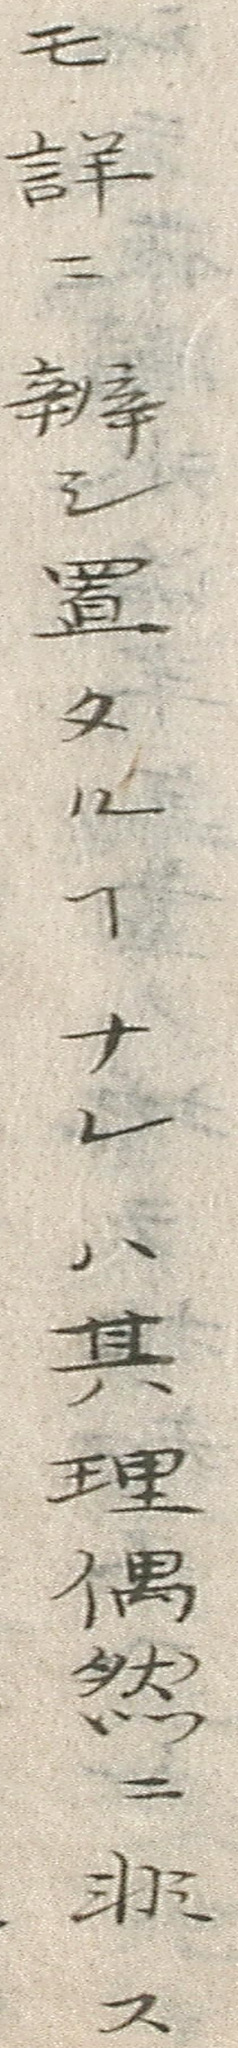モ詳ニ弁シ置タルコトナレハ其理偶然ニ非ス
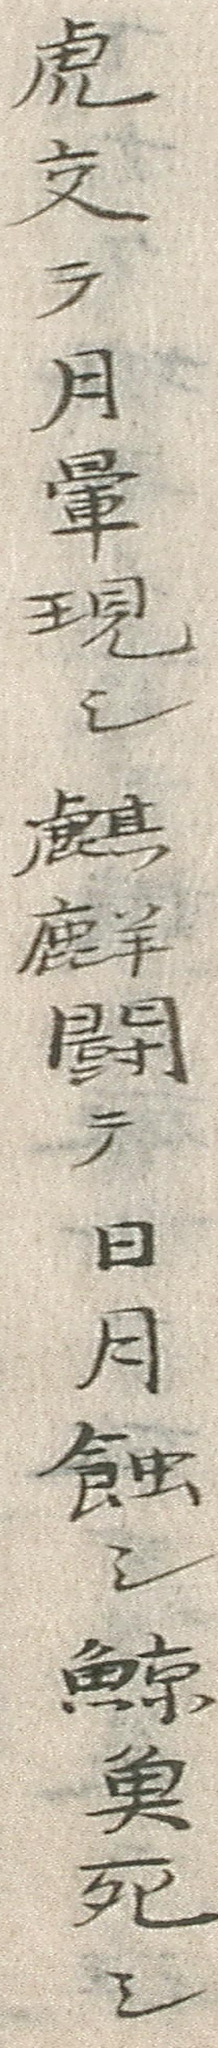虎交テ月暈現シ麒？闘テ日月蝕シ鯨魚死シ
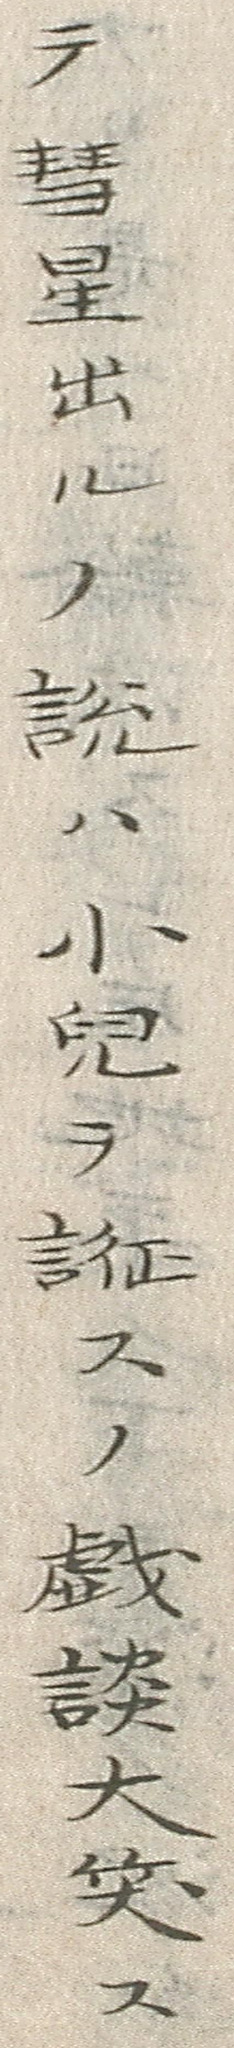テ彗星出ルノ説ハ小児ヲ誑スノ戯談大笑ス
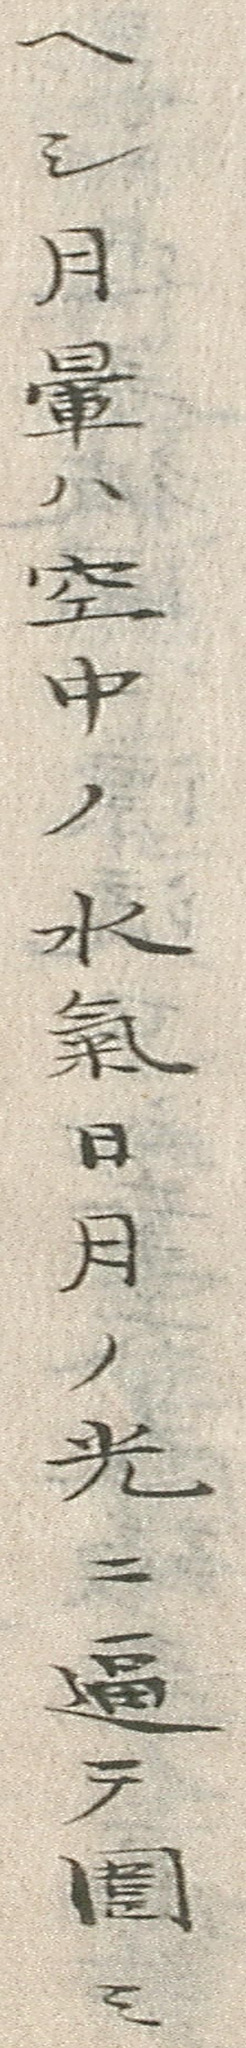ヘシ月暈ハ空中ノ水気日月ノ光ニ逼テ囲ミ
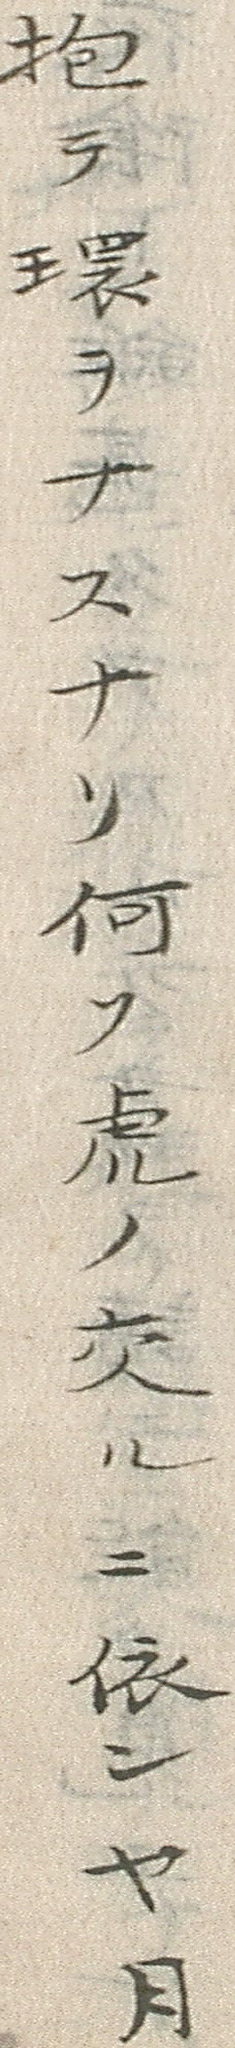抱テ環ヲナスナリ何ソ虎ノ交ルニ依ンヤ月
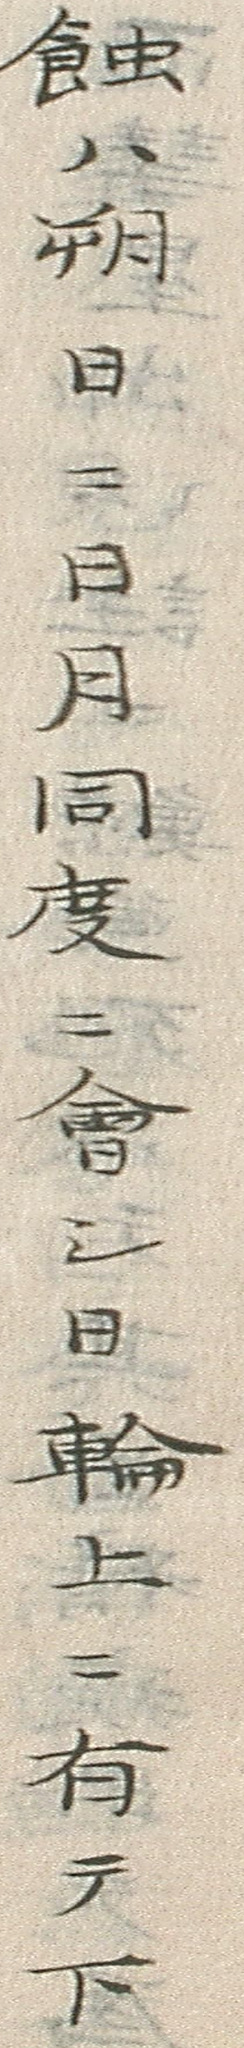蝕ハ朔日ニ日月同度ニ会シ日輪上ニ有テ下
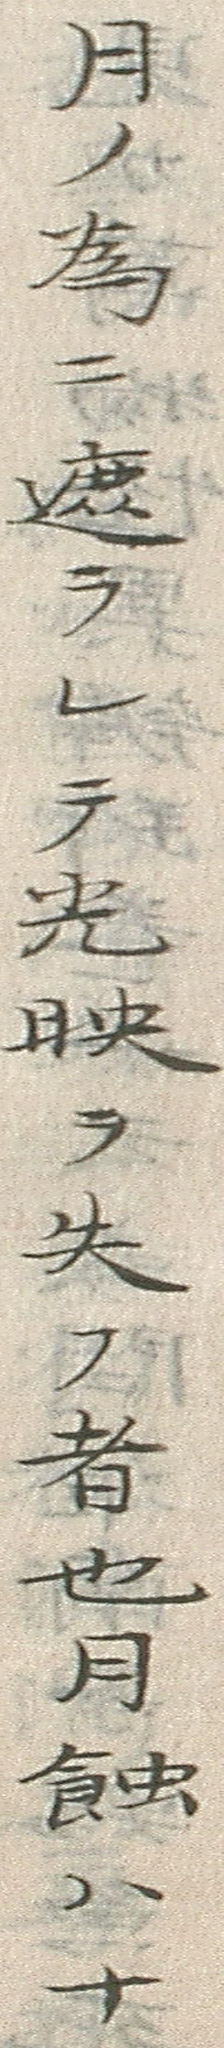月ノ為ニ遮ラレテ光映ヲ失フ者也月蝕ハ十
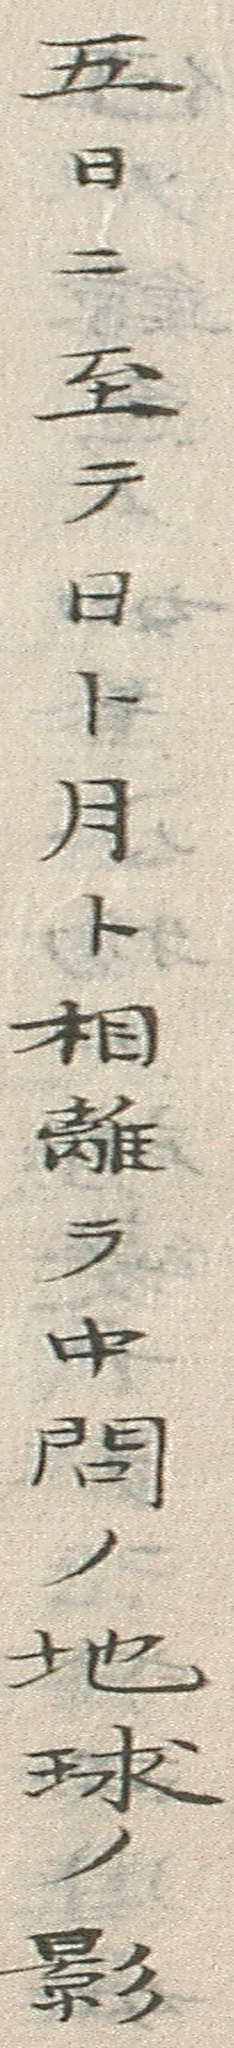五日ニ至テ日ト月ト相離テ中間ノ地球ノ影
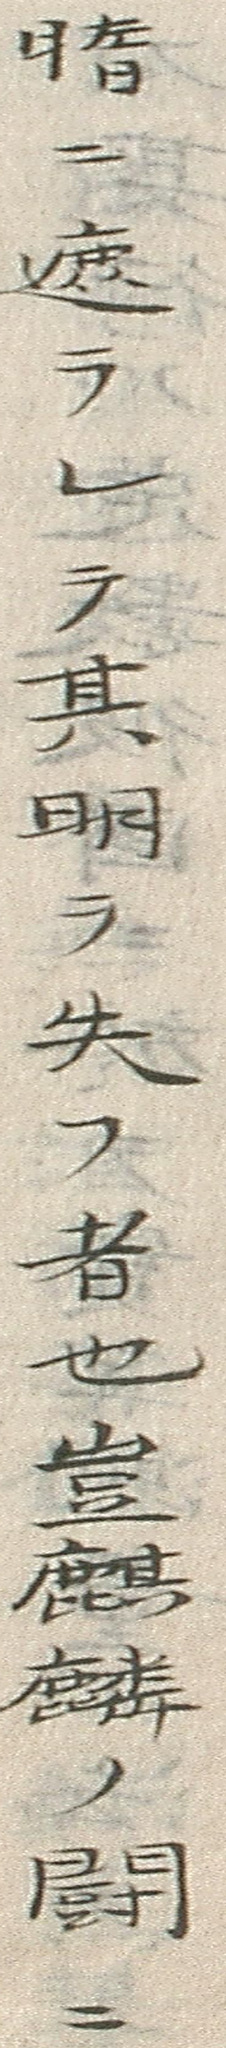？ニ遮ラレテ其明ヲ失フ者也豈麒麟ノ闘ニ
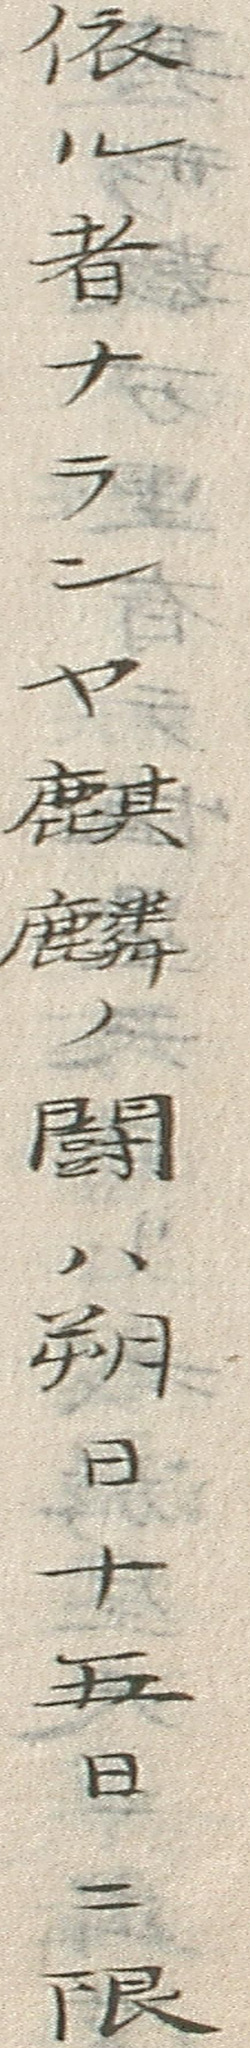依ル者ナランヤ麒麟ノ闘ハ朔日十五日ニ限
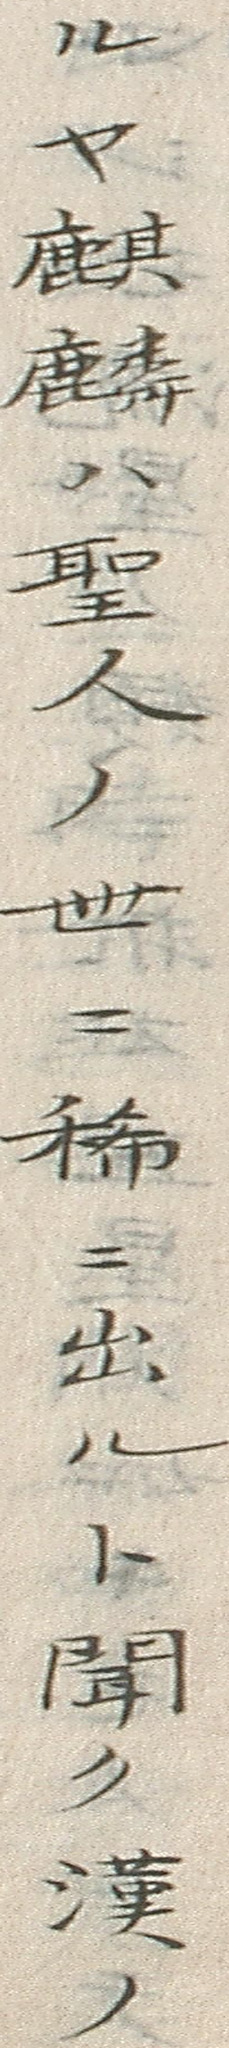ルヤ麒麟ハ聖人ノ世ニ稀ニ出ルト聞ク漢ノ
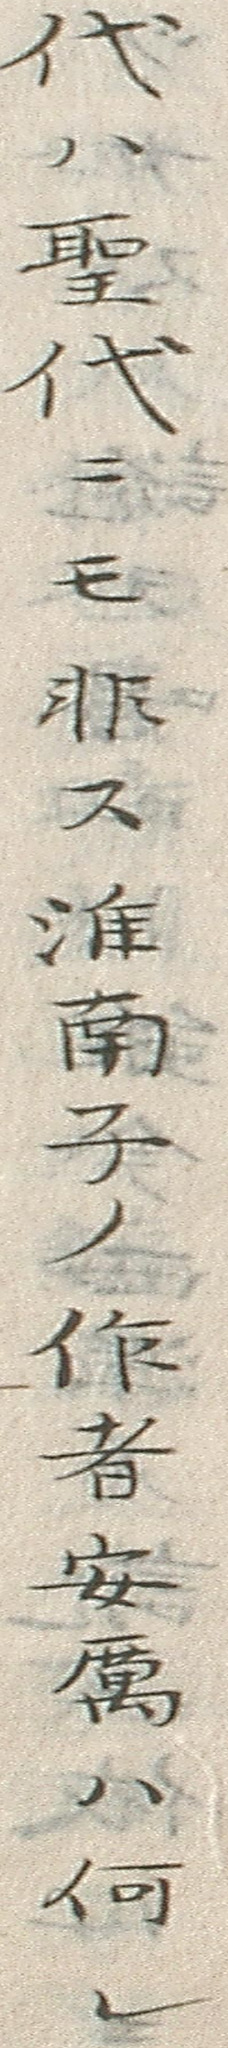代ハ聖代ニモ非ス淮南子ノ作者安厲ハ何レ
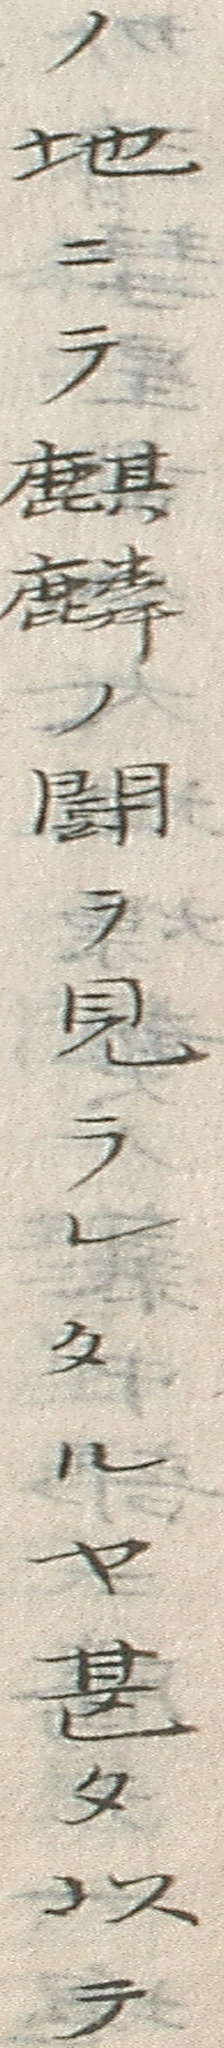ノ地ニテ麒麟ノ闘ヲ見ラレタルヤ甚タ以テ
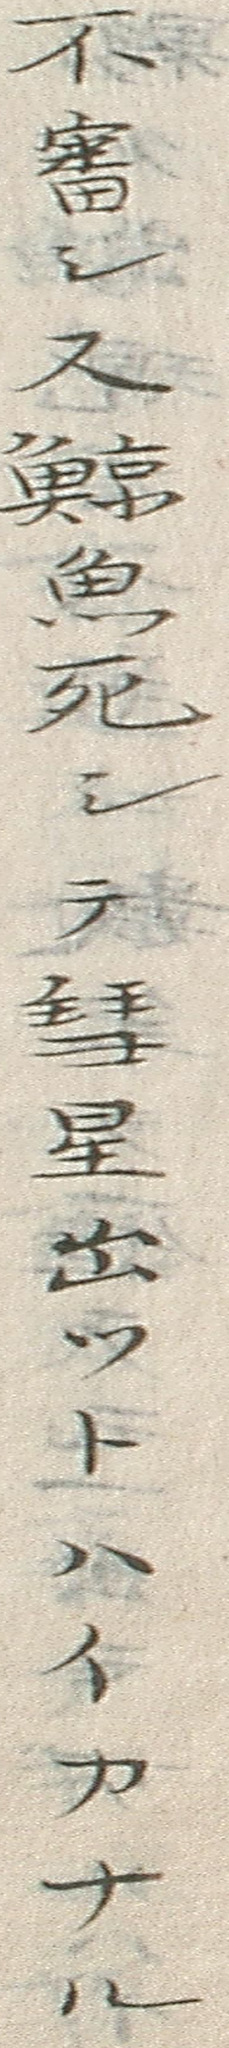不審シ又鯨魚死シテ彗星出ツトハイカナル
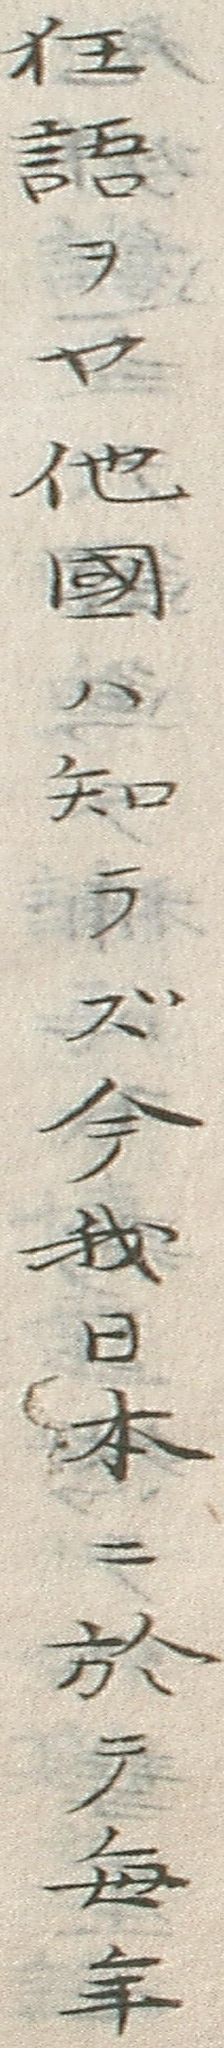狂語ヲヤ他国ハ知ラズ今我日本ニ於テ毎年

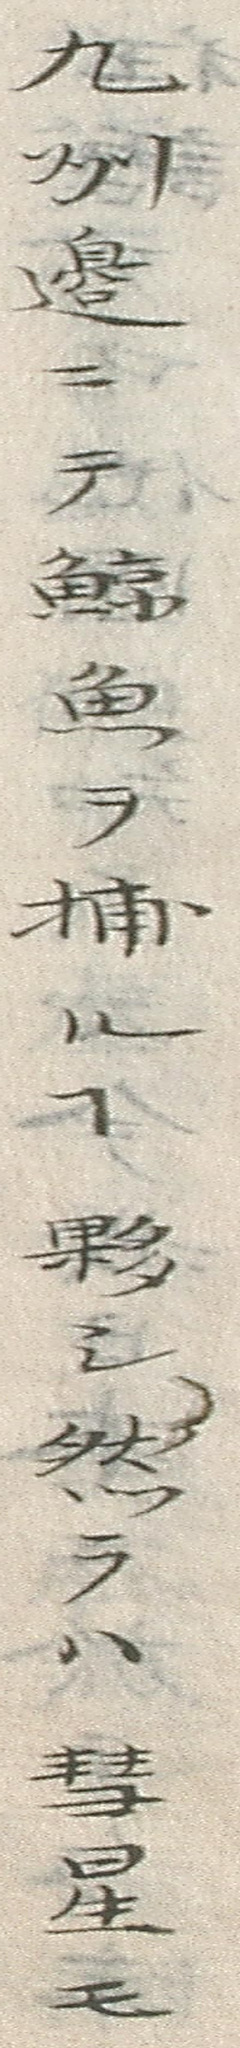九州辺ニテ鯨魚ヲ捕ルコト夥シ然ラハ彗星モ
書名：天學略名目羽翼　全
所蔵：東京大学地震研究所図書室 Earthquake Research Institute Library, The University of Tokyo, JAPAN
